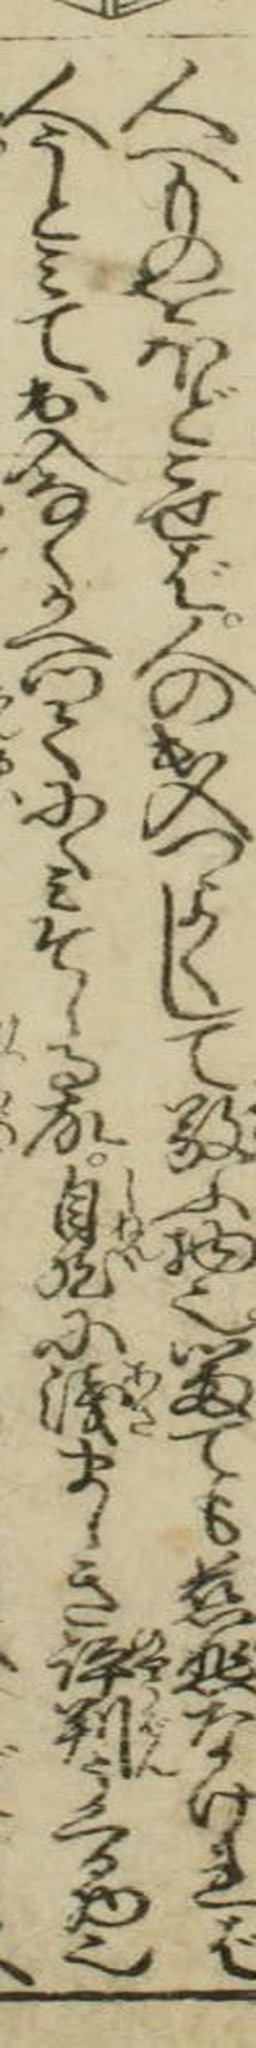人うとみて出入なくかへつてにくみそしる故。自然に浅ましき評判うくる物也
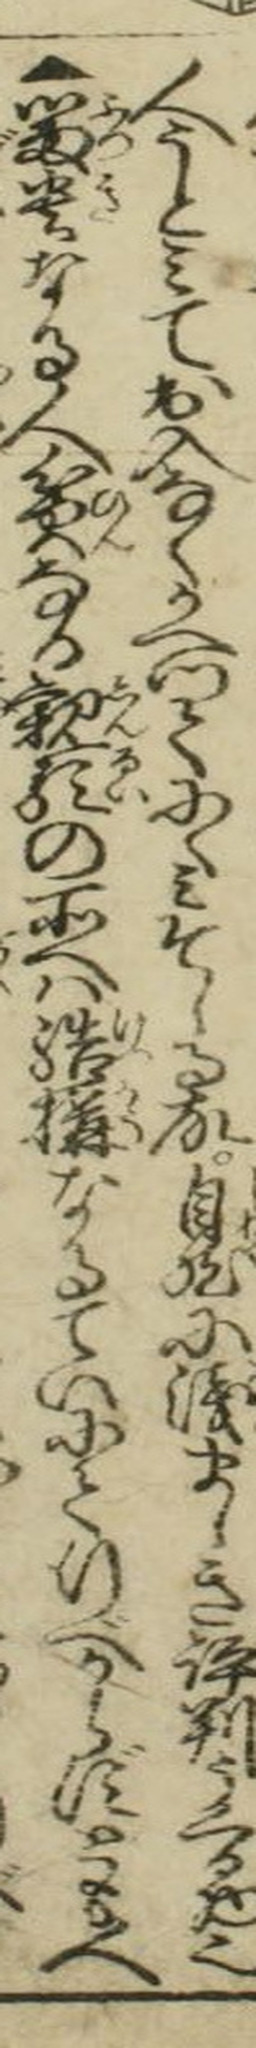▲富貴なる人貧なる親類の所へは結構なるていにて行べからずとも人
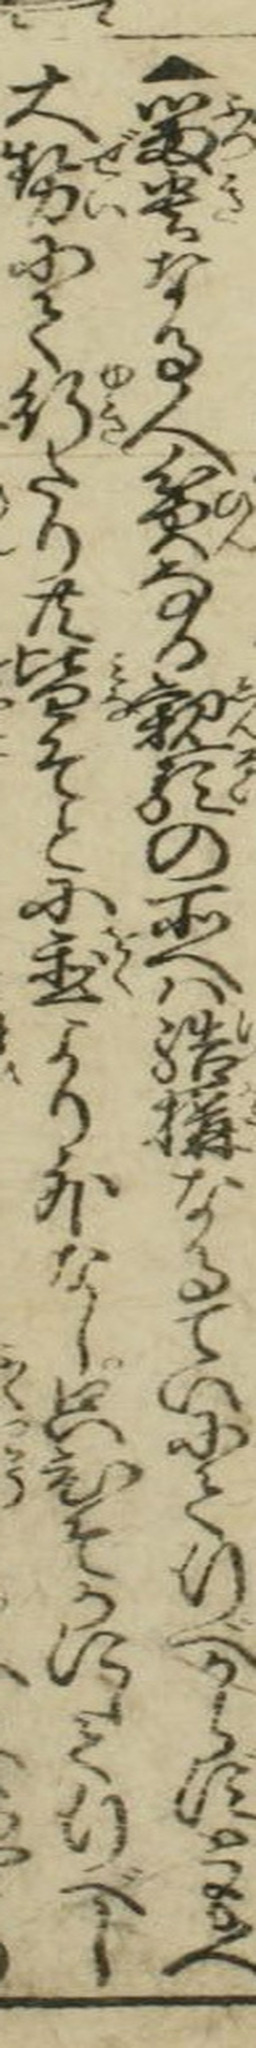大㔟にて行たりとも皆そとに置より外なし。只ひそかにして行べし
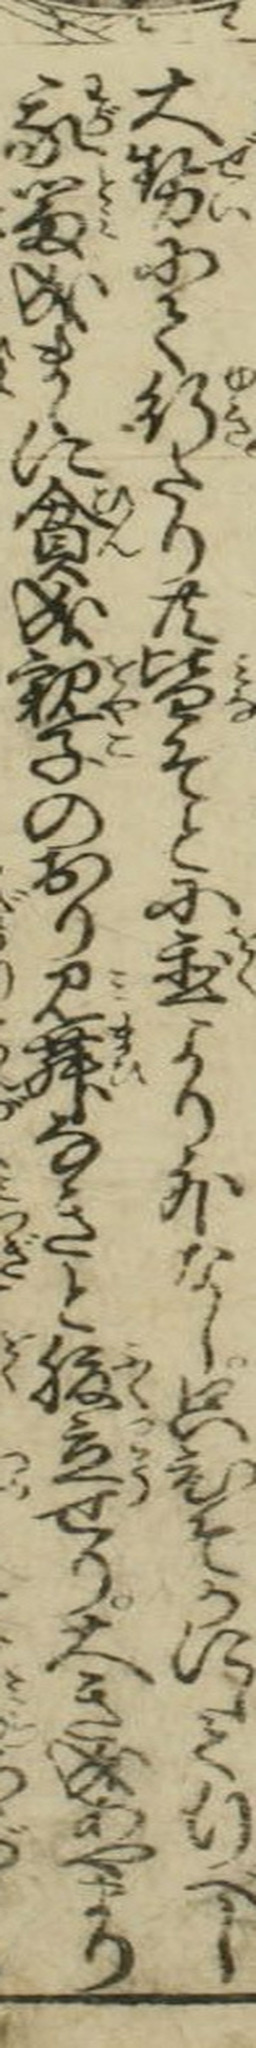我富成まゝに貧成親子のおり見舞なきと腹立せり。大き成あやまり
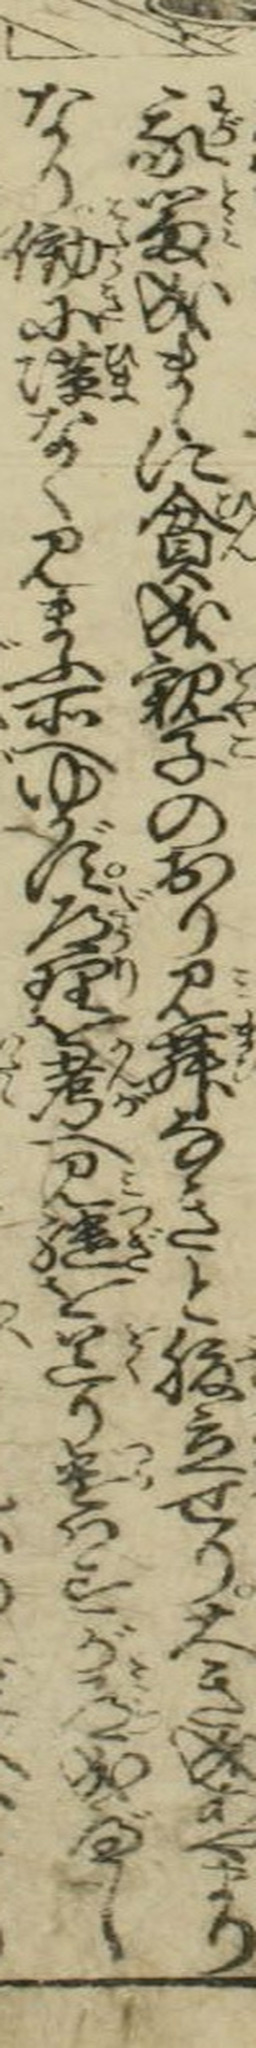なり。働に隙なく見まふ所へゆかず。道理を考へ見継を送り遣はすが道成べし
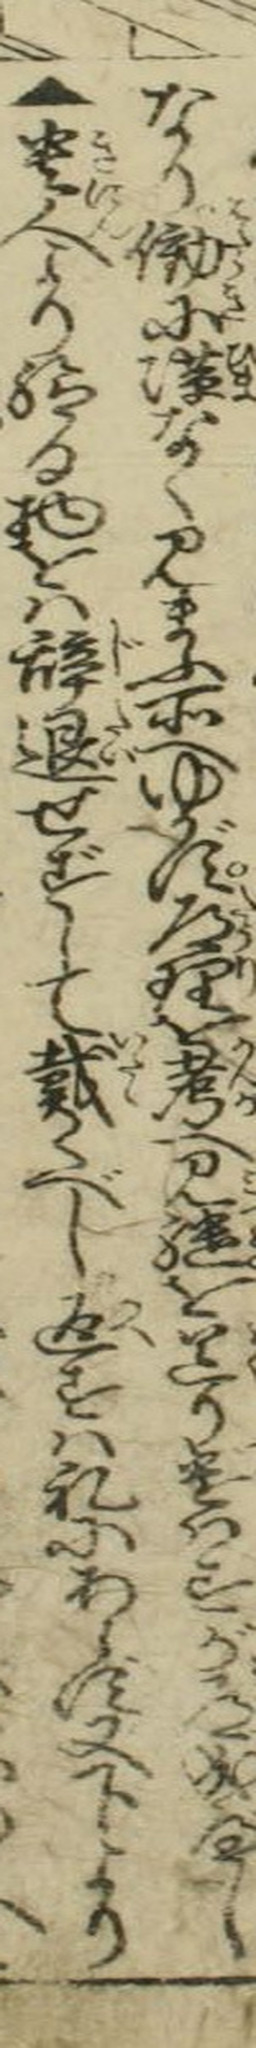▲貴人より給る物をは辞退せずして戴くべし。返すは礼にあらず又下より
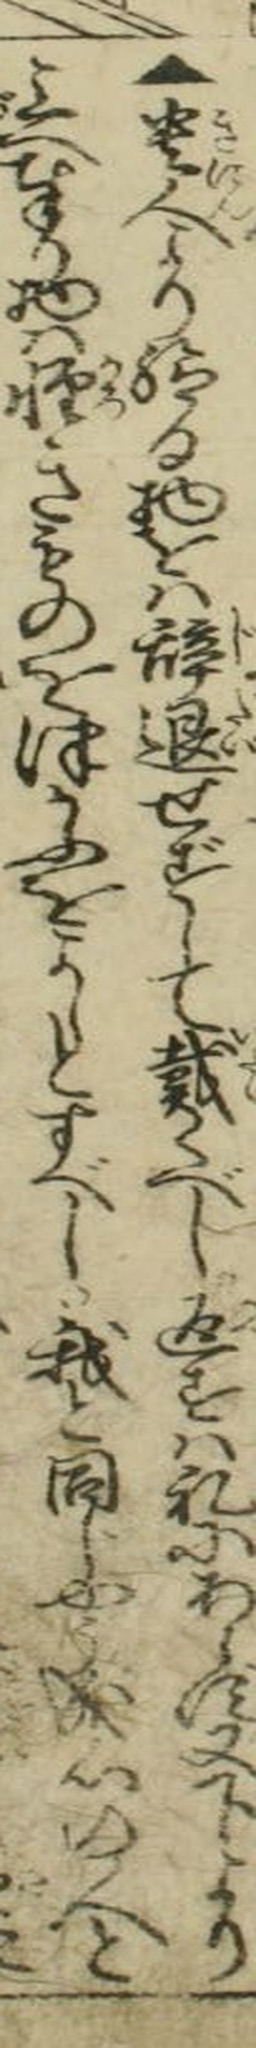上へ奉り物は軽きものをつかふをよしとすべし。我と同じやう成心の人と
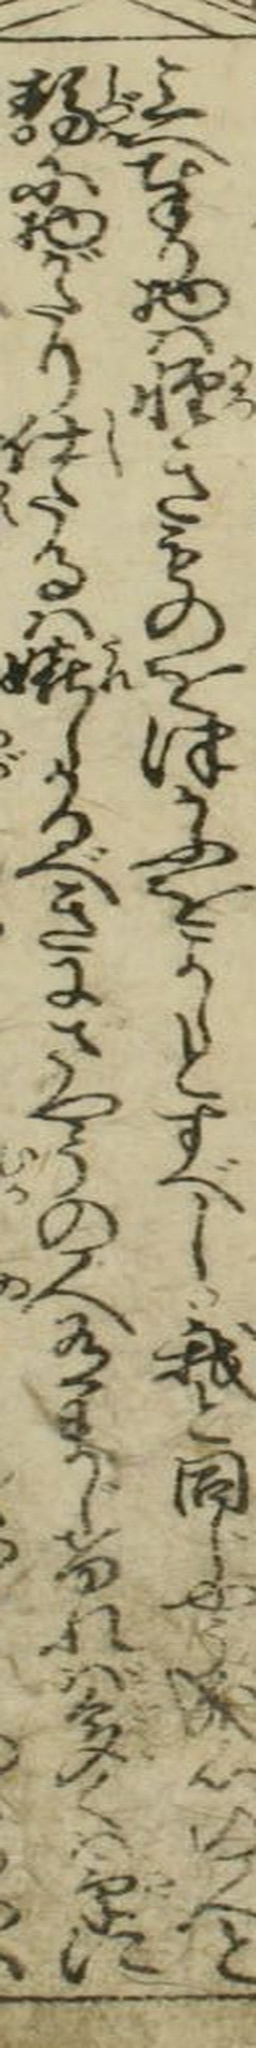静に物がたり仕たるは嬉しかるべきにさやうの人有まじければ多くは氣に
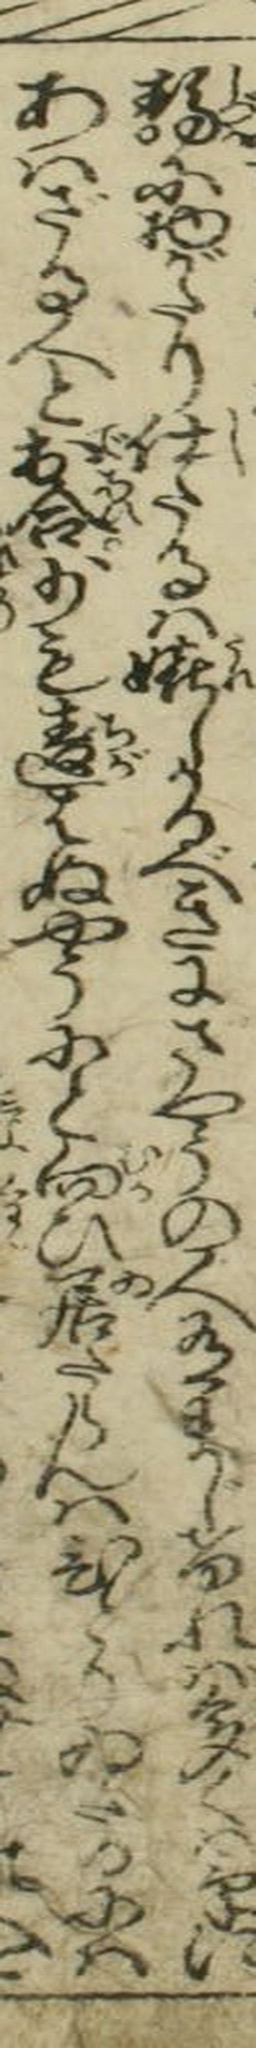あはざる人と出合。少も違はぬやうにと向ひ居たらんはひとりゐたるには
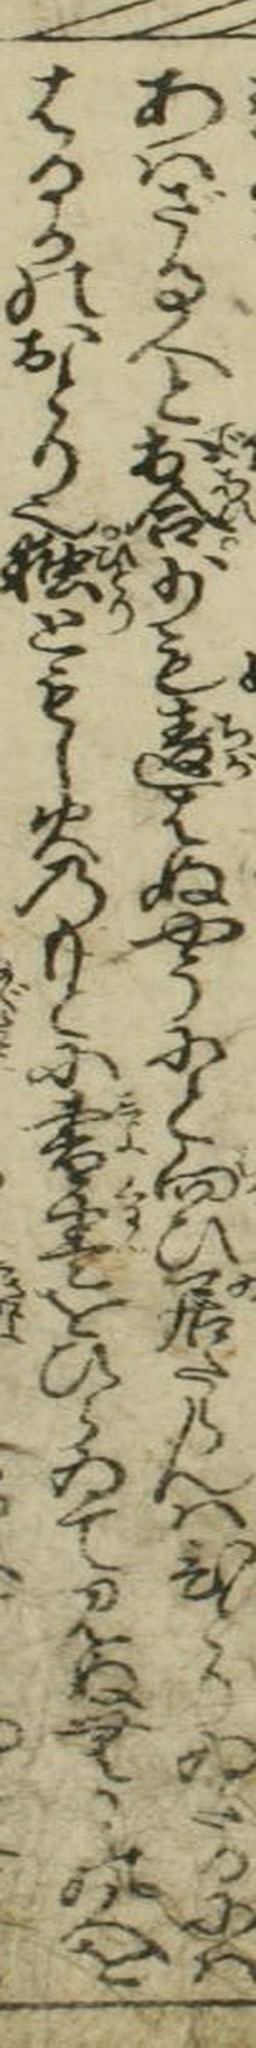はるかのおとり也。独ともし火のもとに書巻をひらゐて見ぬむかの人を
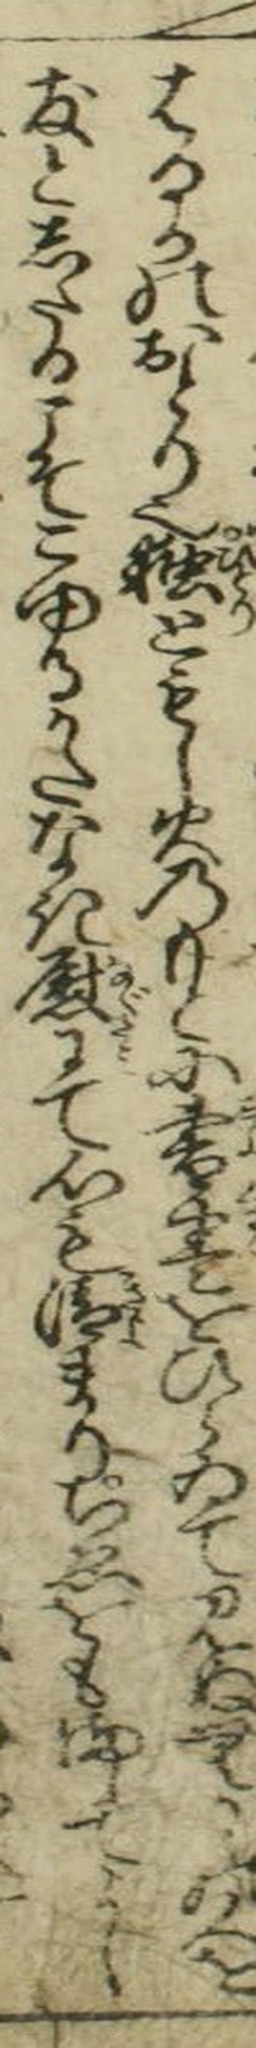友としたるこそこゆるかたなき慰にて心も清まり。ちゑをもましてよし
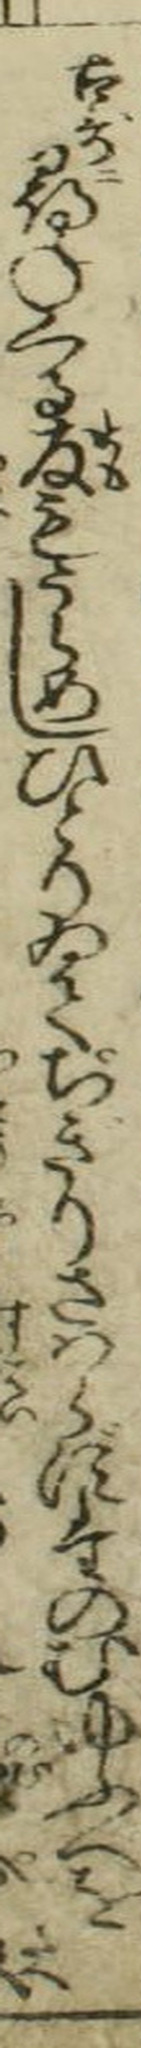尋ねくる友もうらめしひとりゐて。ちぎりさはらずたのむゆふへを
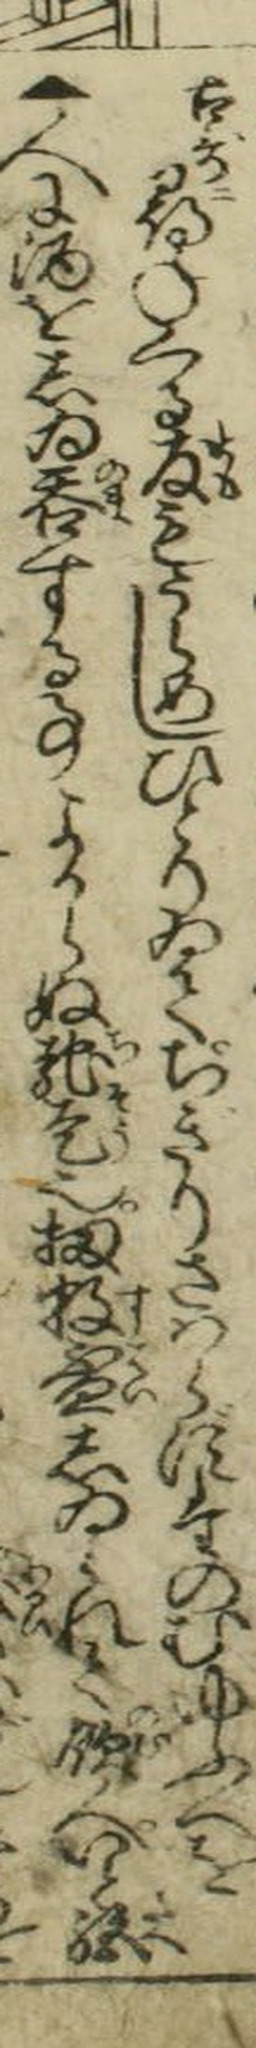▲人に酒をしゐ呑する事よからぬ馳走なり。扨数盃しゐられて飲人いと絶
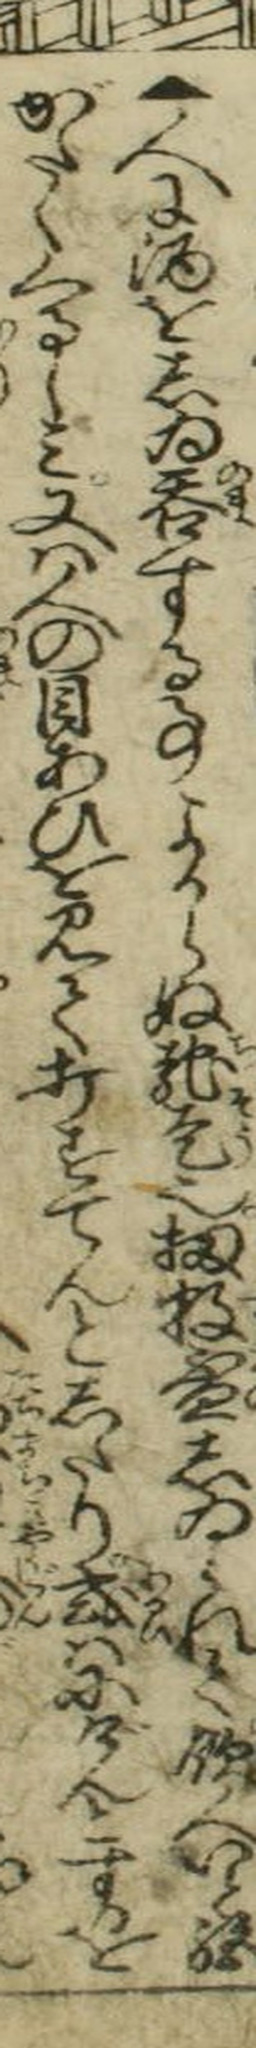がたくくるしみ。又は人の目あひを見て打すてんとしたり。或はにげんとするを
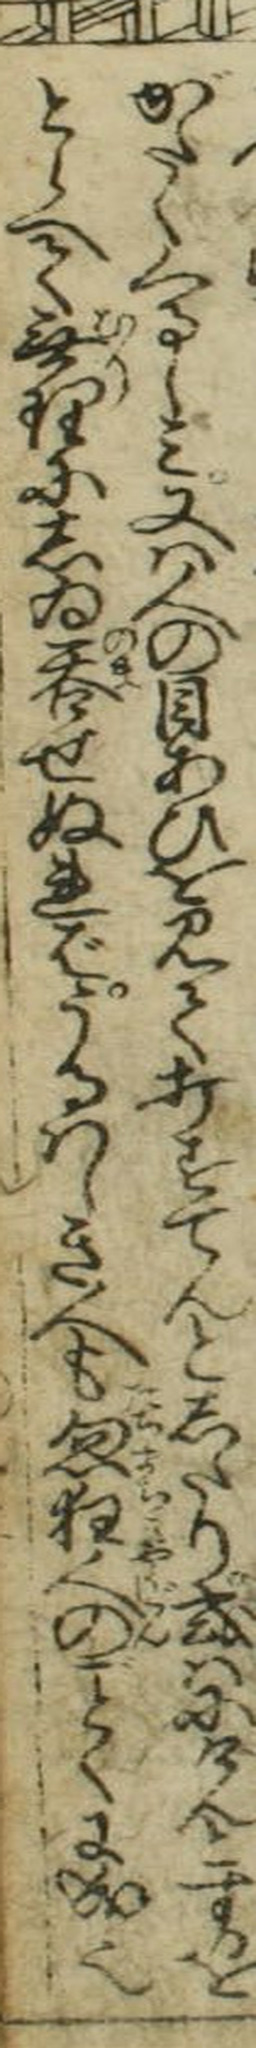とらへて無理にしゐ呑せぬれば。うるはしき人も忽狂人のごとくに成也

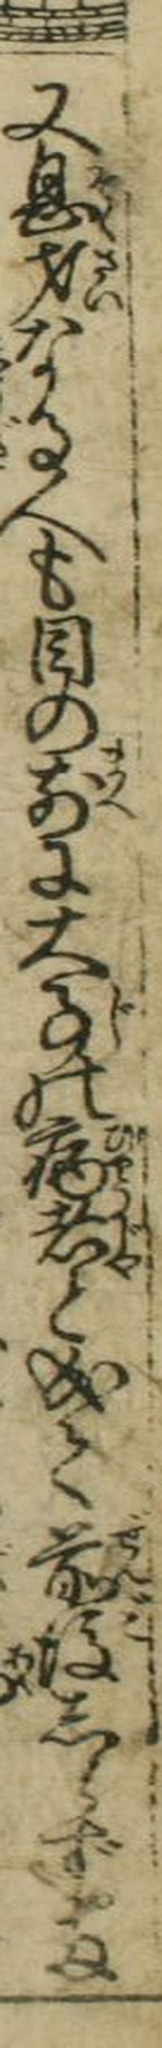又息才なる人も目の前に大事の病者と成て前後しらず。た
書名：女源氏教訓鑑
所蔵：東京学芸大学附属図書館
